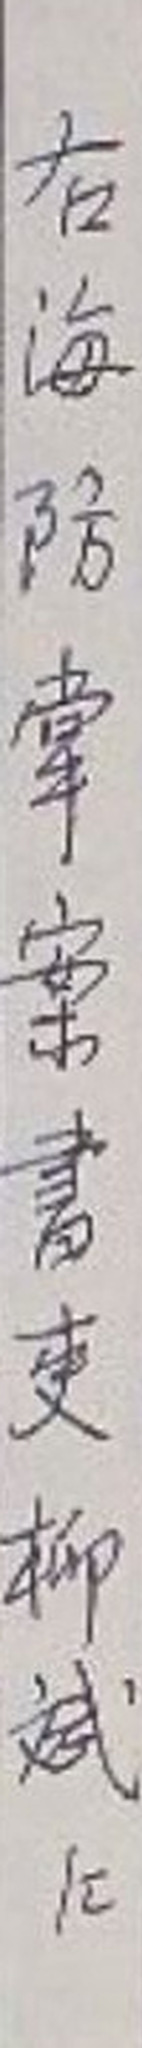右海防掌案書吏柳斌え
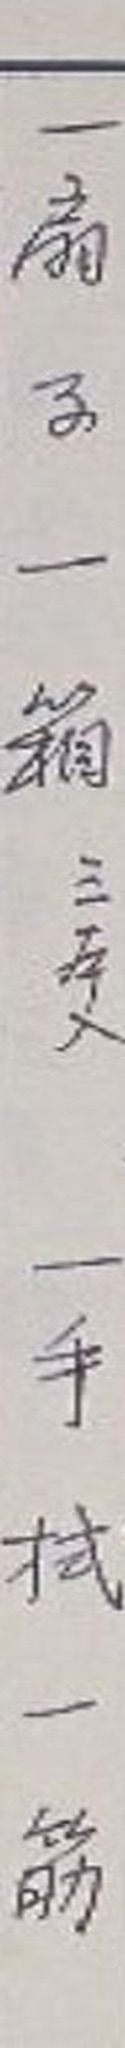一扇子一箱三本入一手拭一筋
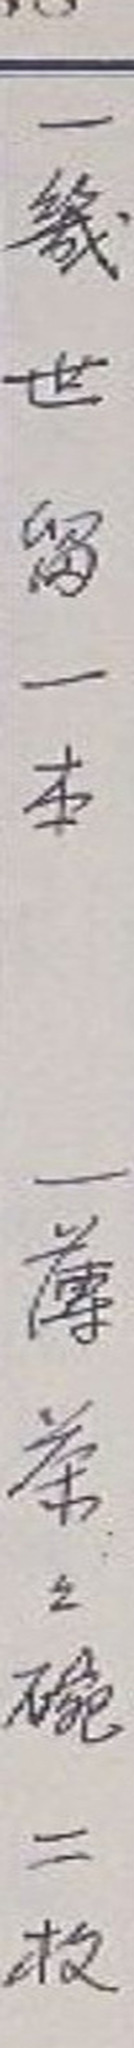一幾世留一本一薄茶々碗二枚
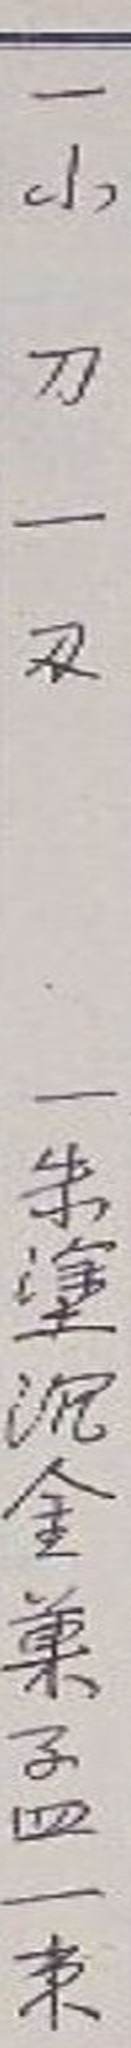一小刀一刃一朱塗沈金菓子皿一束
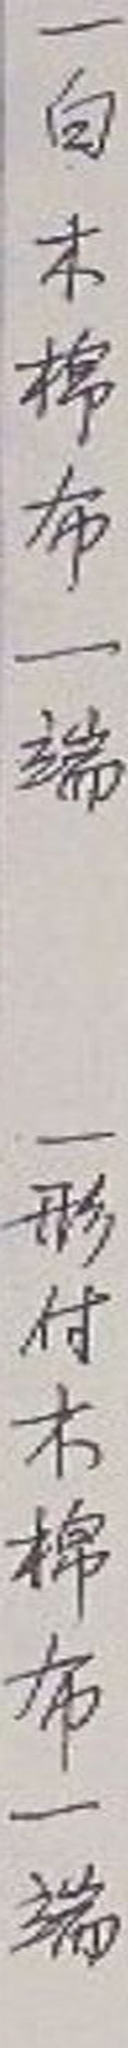一白木綿布一端一形付木棉布一端
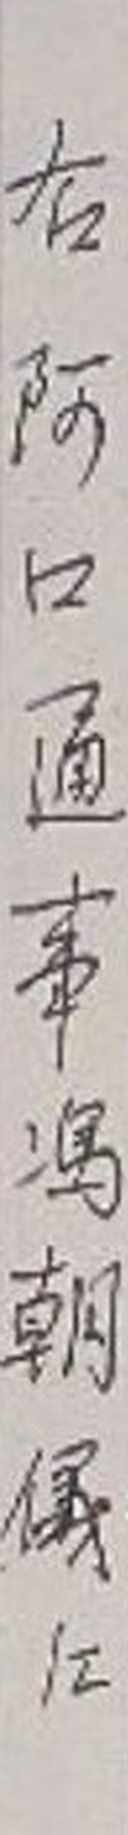右阿口通事馮朝儀え

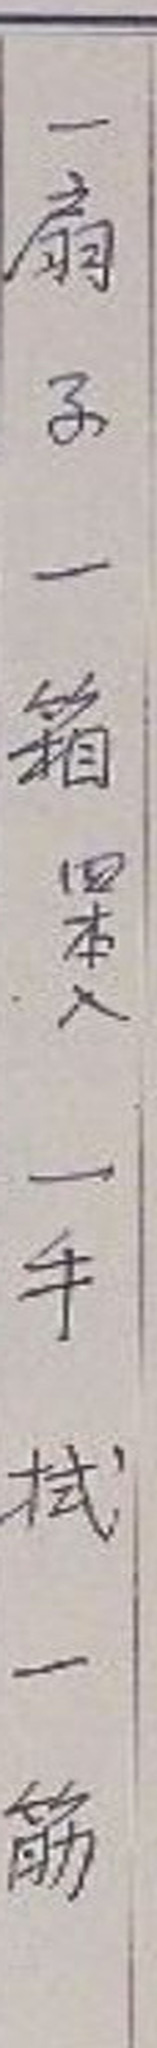一扇子一箱四本入一手拭一筋
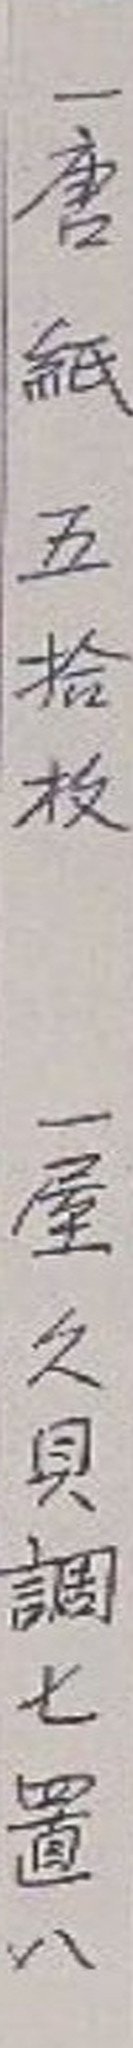一唐紙五拾枚一屋久貝調匕置八
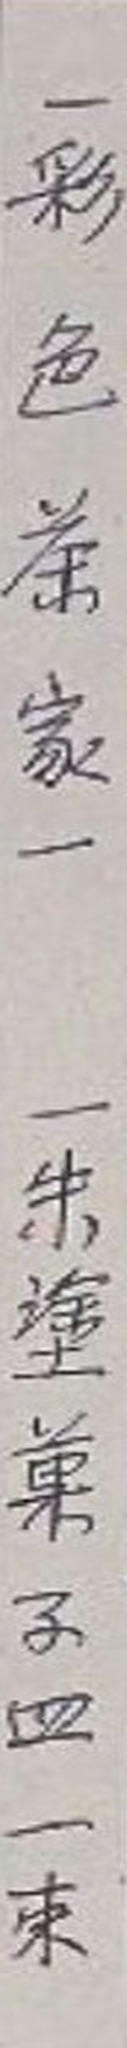一彩色茶家一一朱塗菓子皿一束
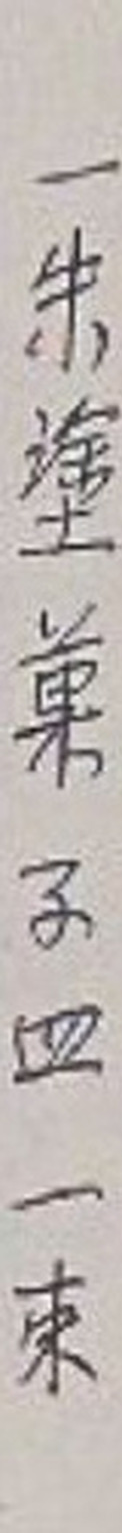一彩色茶家一一朱塗菓子皿一束
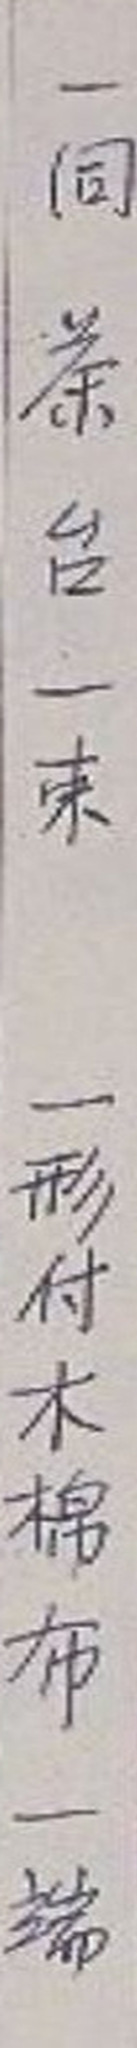一同茶台一束一形付木棉布一端
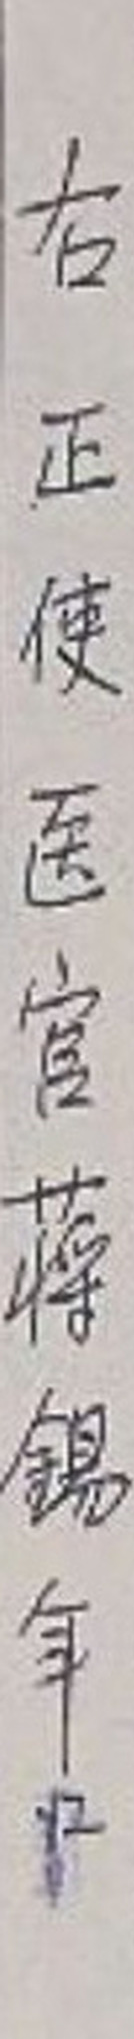右正使医官䉃錫年え
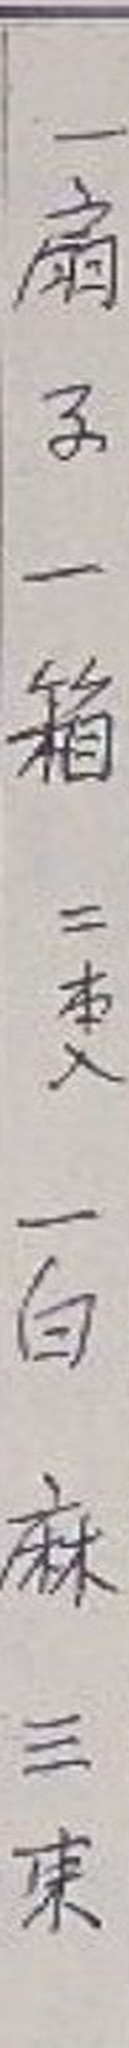一扇子一箱二本入一白麻三束
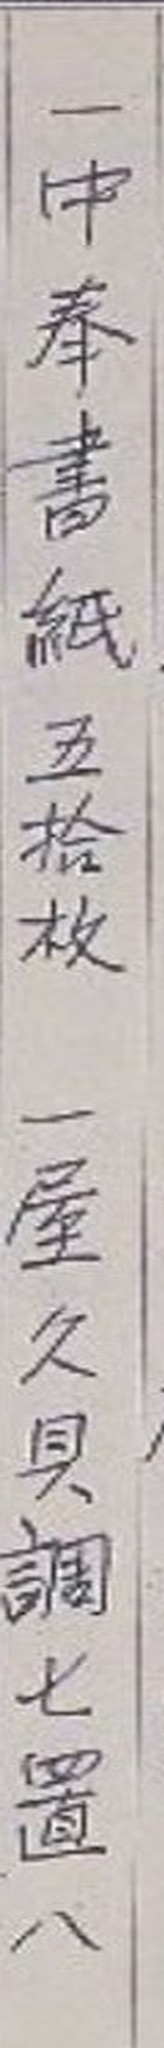一中奉書紙五拾枚一屋久貝調匕置八
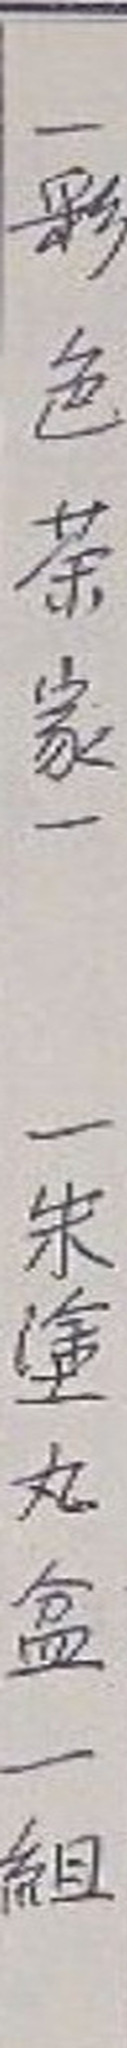一彩色茶家一一朱塗丸盆一組
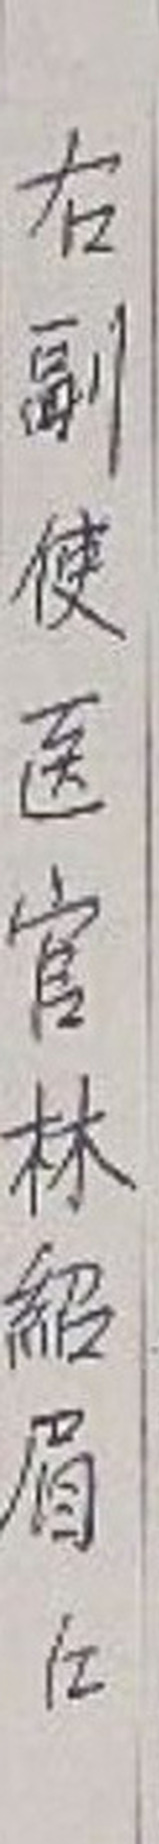右副使医官林紹眉え
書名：支那冊封使来琉諸記 下巻
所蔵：University of the Ryukyus Library
